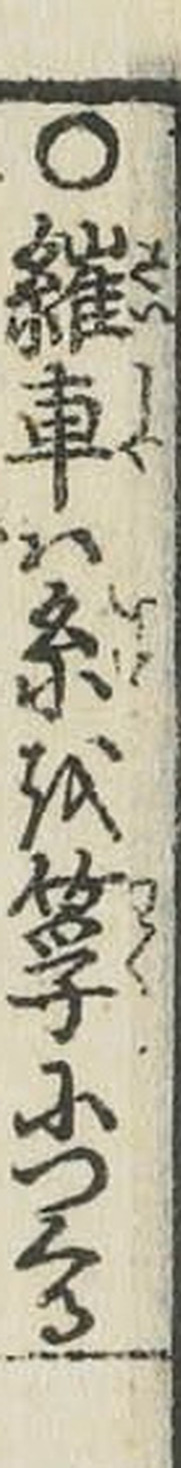○繀車は糸を筟につくる
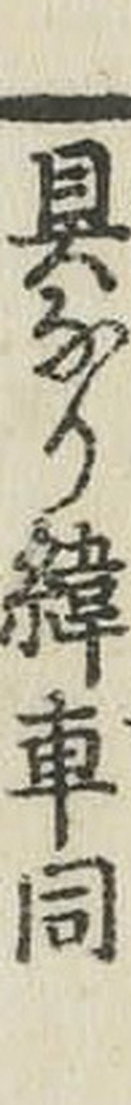具なり緯車同
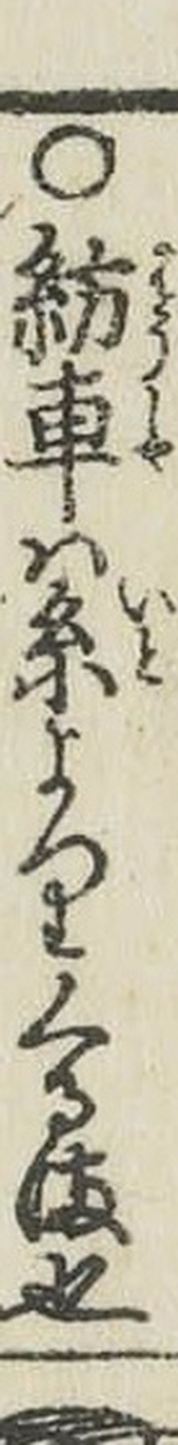○紡車は糸よりくるま也
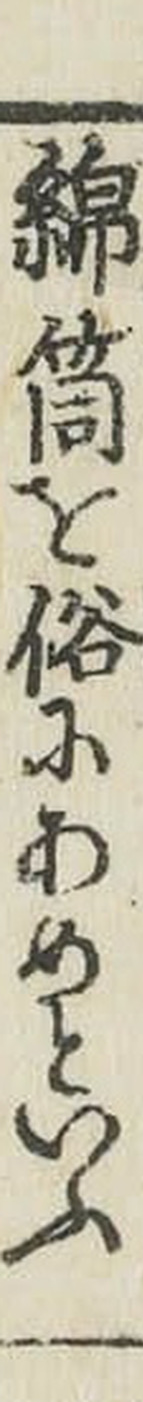綿筒を俗にあめといふ
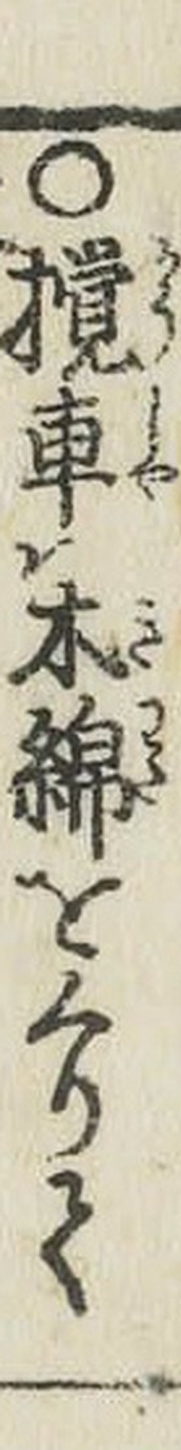○撹車は木綿をくりて
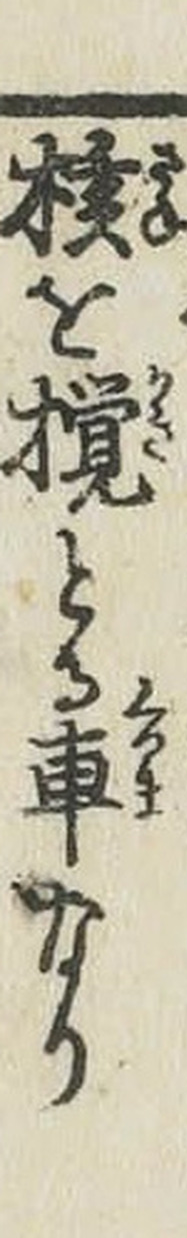核を撹とる車なり
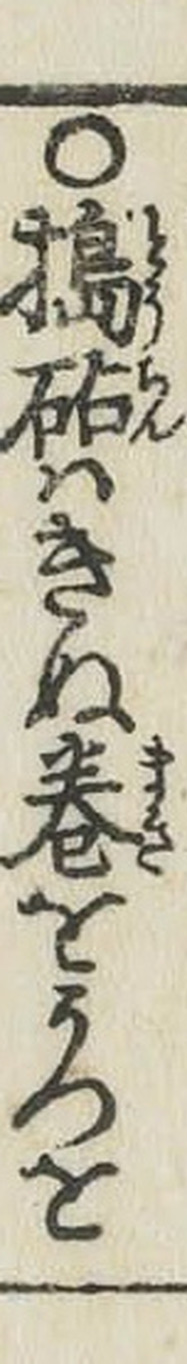○搗砧はきぬ巻をうつを
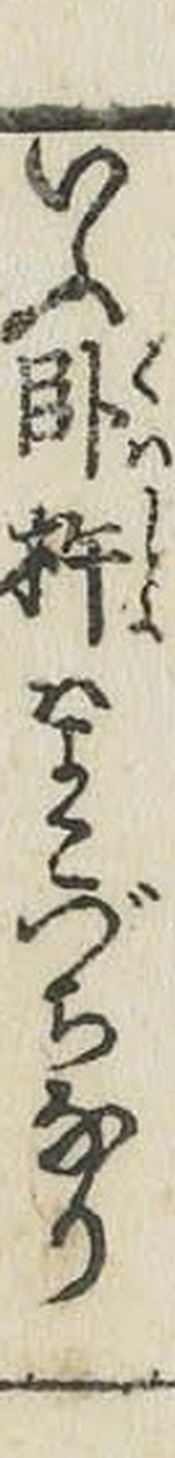いふ臥杵はよこづちなり
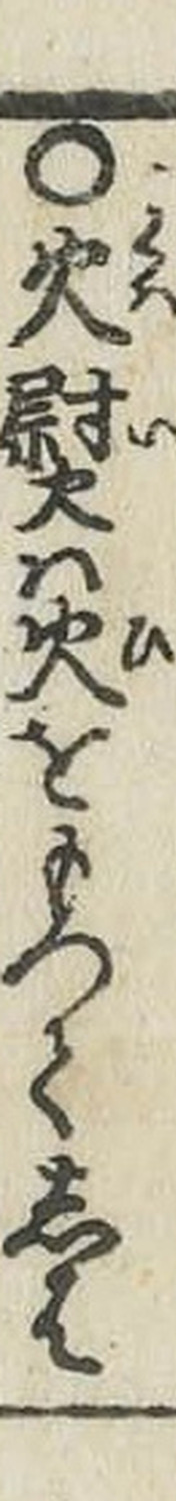○火熨は火をもつてしは
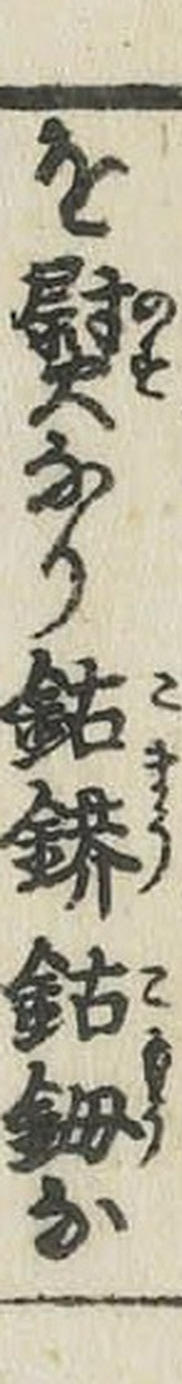を熨なり鈷▢鈷鉧な
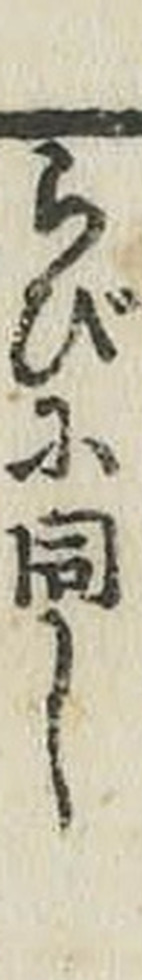らびに同し
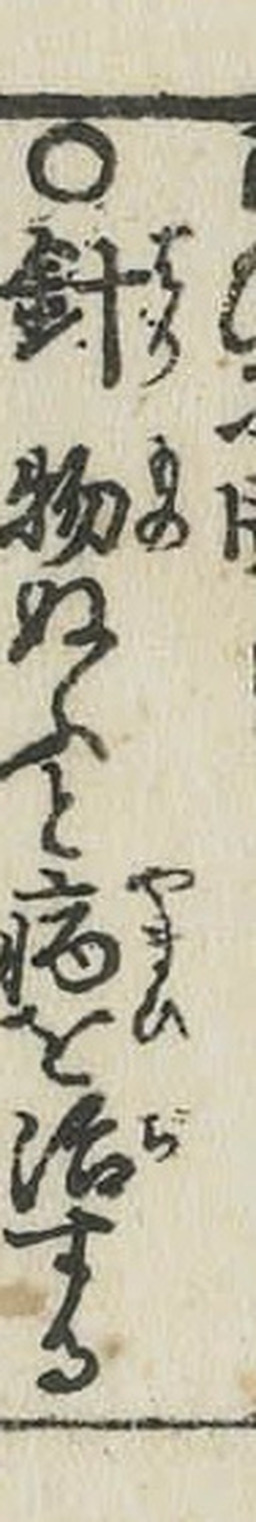○針物ぬふと病を治する
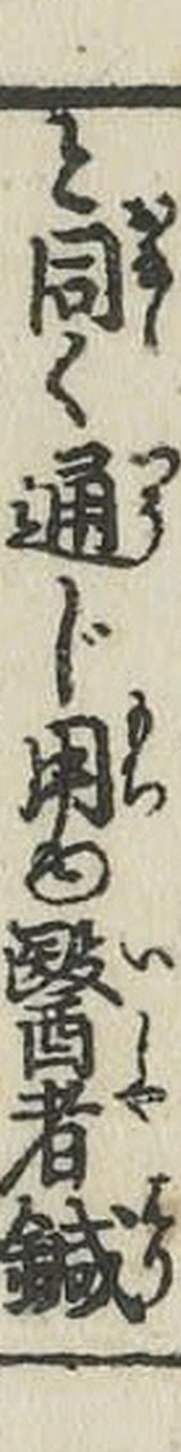と同く通じ用ゆ医者鍼
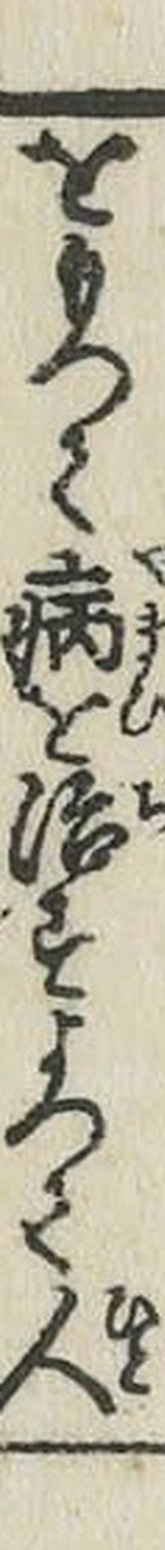をもつて病を治すよつて人
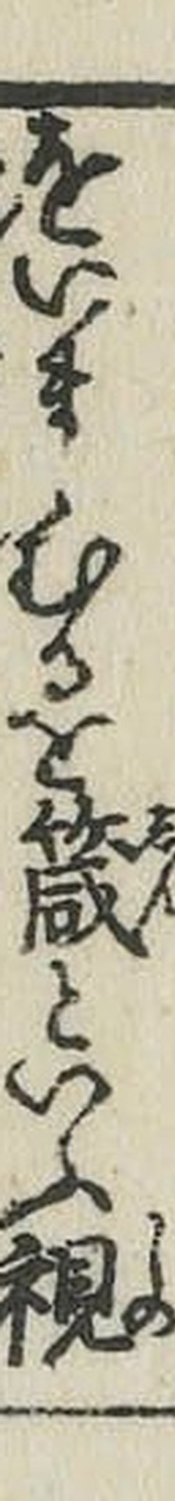をいましむるを箴といふ視
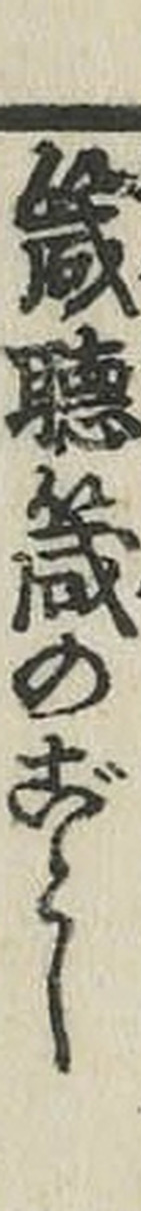箴聴箴のごとし
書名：増補頭書訓蒙図彙大成 10巻 5:巻之9-11
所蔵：東京学芸大学教育コンテンツアーカイブ
